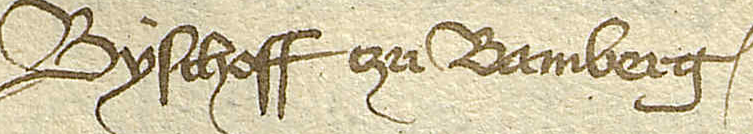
Byſchoff cʒu Bamberg
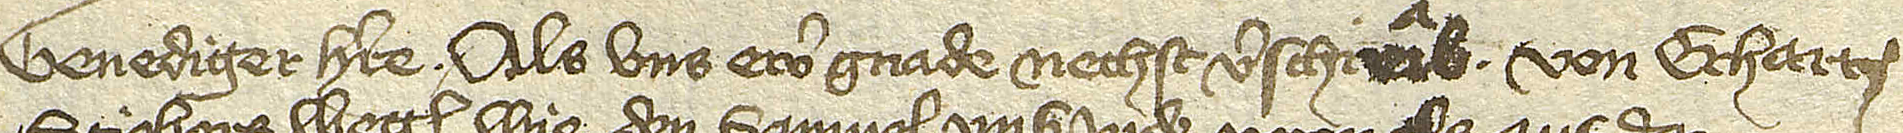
Genediger h*re . / Als vns ew* gnade nechſt v*ſchreib . von Erhart*
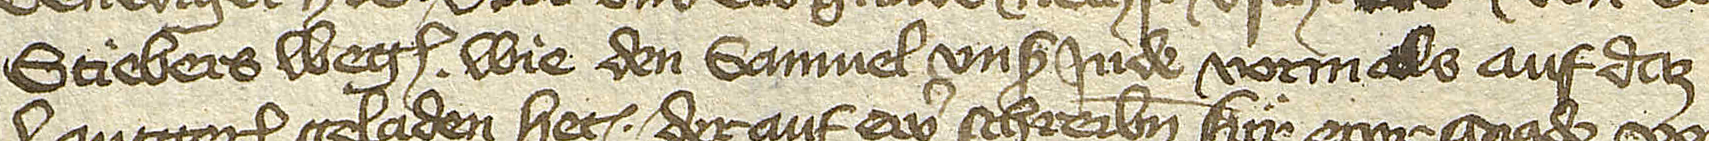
Stiebers weg* . wie den Samuel vnſ* Iude vormals auf daʒ
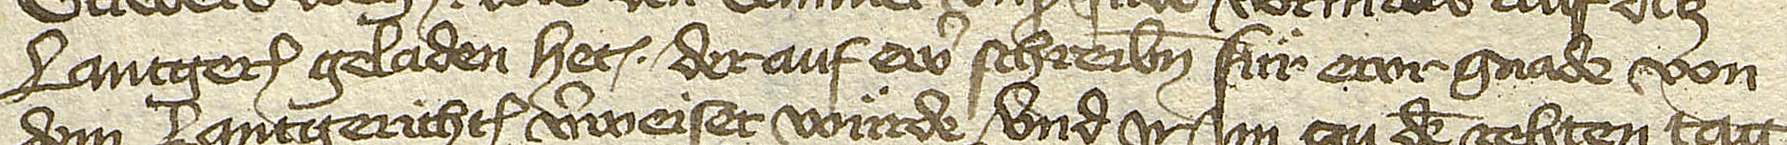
Lantger* geladen het* . / der auf ew* ſchreibn* für ewr gnade von
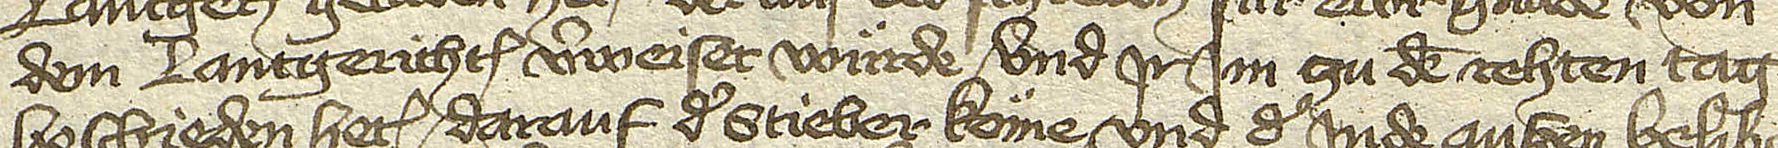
dem Lantgericht* v*weiſer würde / vnd Ir Im cʒu de* rehten tag
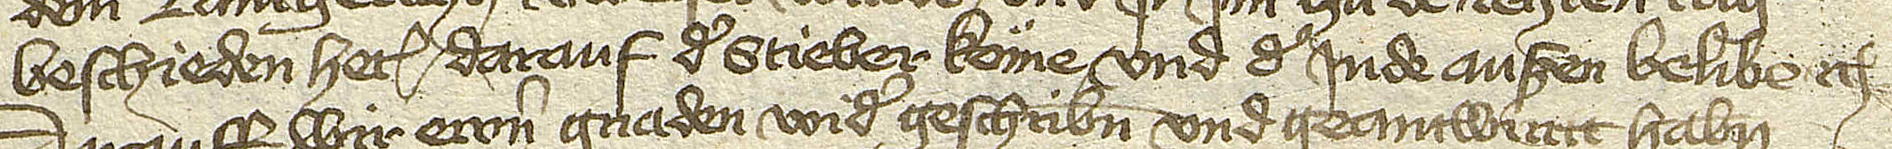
beſchieden het* / darauf d* Stieber köme / vnd d* Iude auſʒen belibe ec*
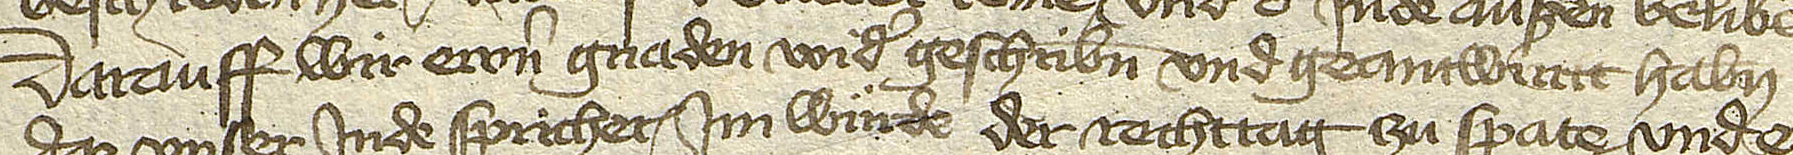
Darauff wir ewn* gnaden wid* geſchribn vnd geantwurtt habn*
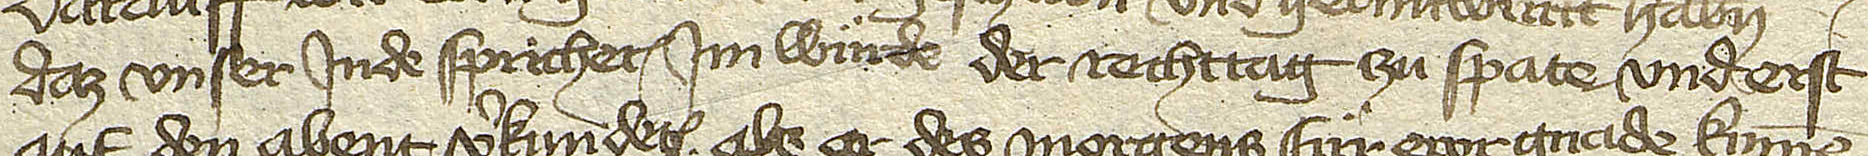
daʒ vnſer Iude ſprichet / Im würde der rechttag cʒu ſpate vnd erſt
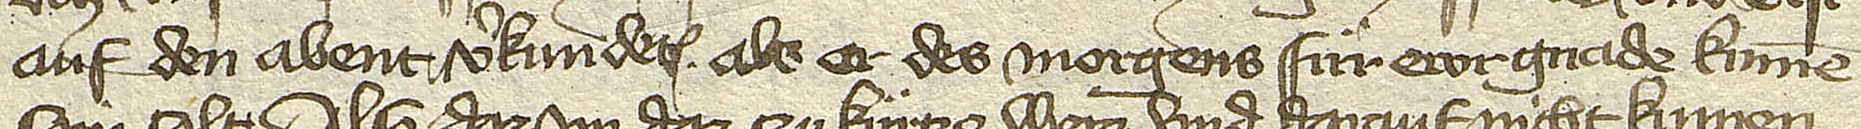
auf den abent v*kundet / . als er des morgens für ewr gnade kume*
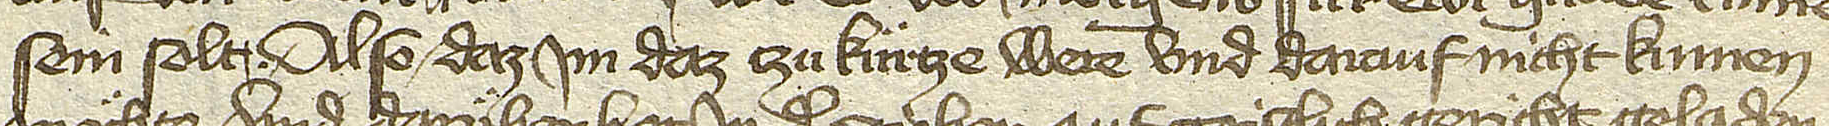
ſein ſolt . / Alſo / daʒ Im daʒ cʒu kürcʒe were vnd darauf nicht kumen
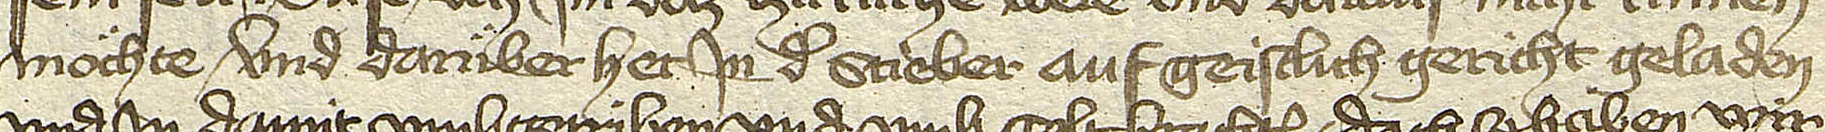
möchte / vnd darüber het In d* Stieber auf geiſtlich gericht geladen
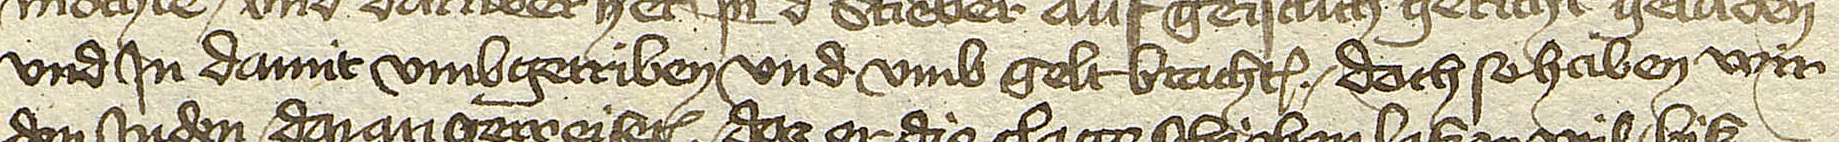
vnd In damit vmbgetriben vnd vmb gelt bracht* . / doch ſo haben wir
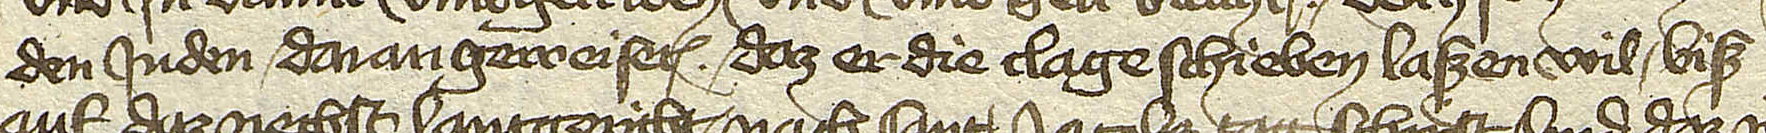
den Iuden / daran geweiſet . / daʒ er die clage ſchieben laſʒen wil / biʒ
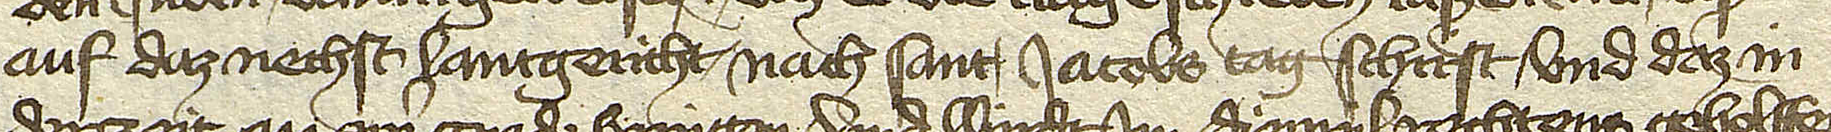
auf daʒ nechſt lantgericht nach ſant Iacobs tag ſchirſt / vnd daʒ in
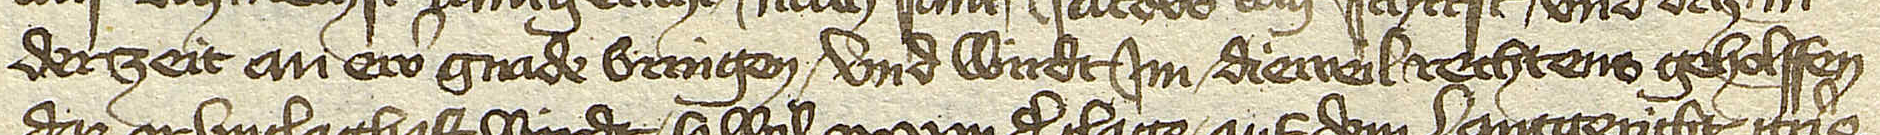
dercʒeit an ew* gnade bringen / vnd wirdt Im / dieweil rechtens geholffen
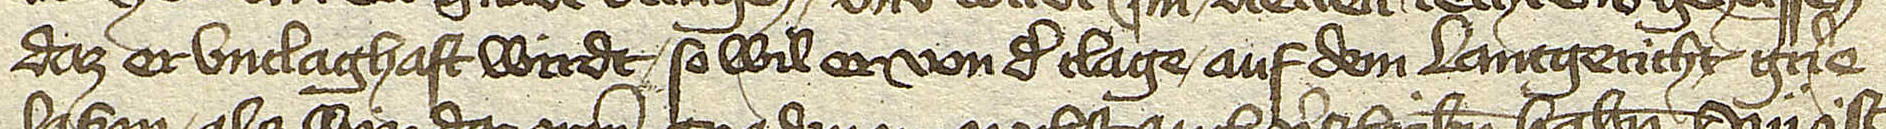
daʒ er vnclaghaft wirdt / ſo wil er von d* clage / auf dem Lantgericht gn*e
